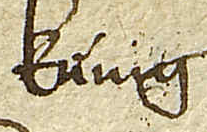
künig
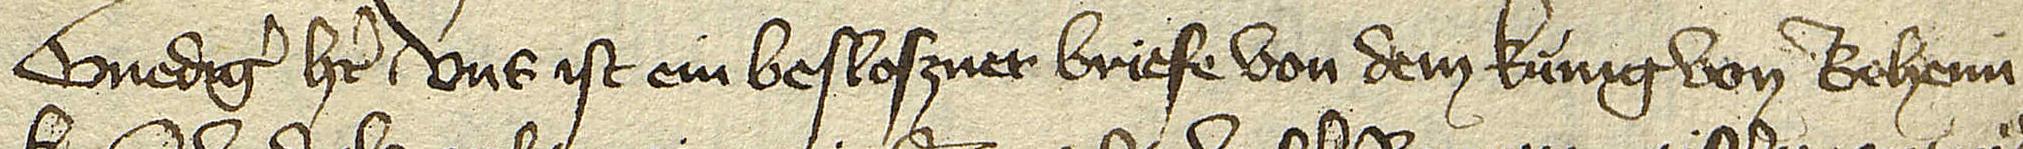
Gnedig* hr* / Vns iſt ein beſloſʒner briefe von dem künig von Beheim
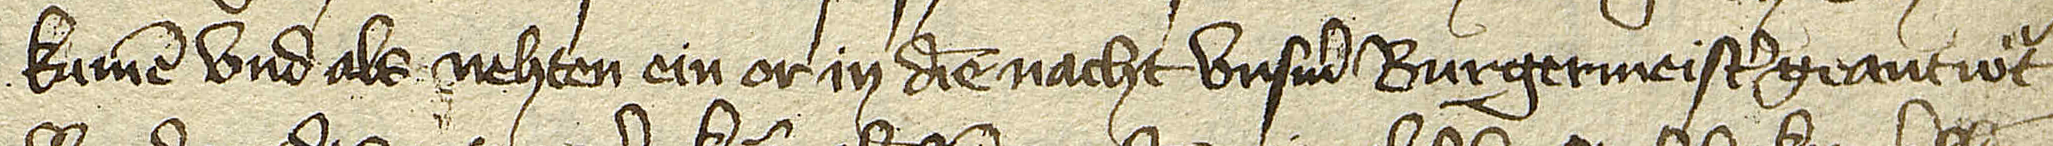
kume* vnd als nehten ein or in die nacht vnſm* Burgermeiſt* geantw*t
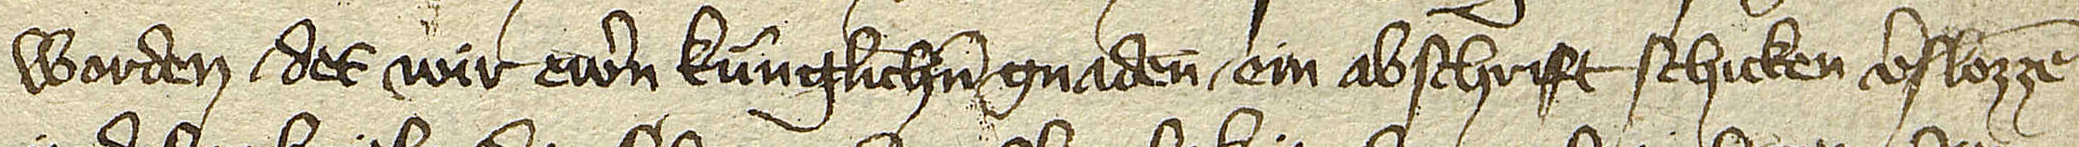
worden / des wir ewn* künglichn* gnaden / ein abſchrift ſchicken v*ſloʒʒe*
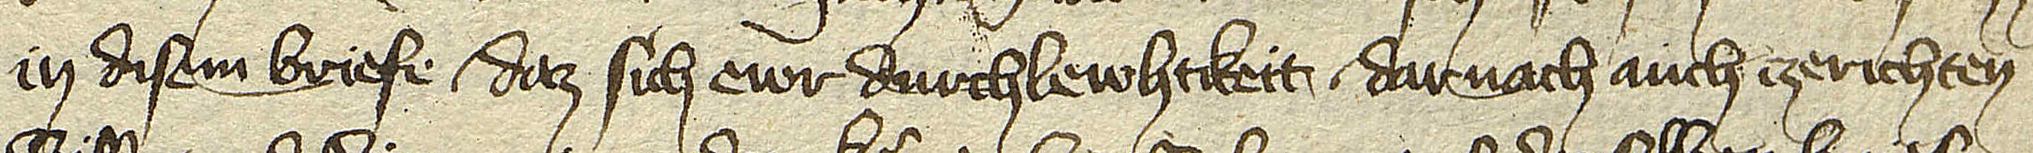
in diſem briefe / daʒ ſich ewr* durchlewhtikeit / darnach auch cʒerichten
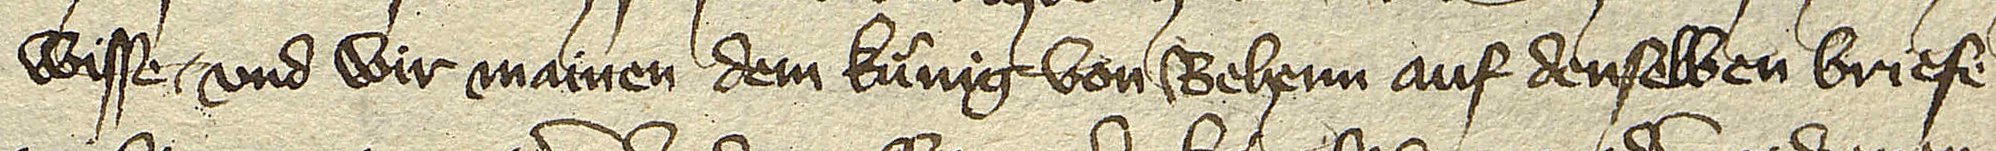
wiſſe / vnd wir mainen dem künig von Beheim auf denſelben briefe
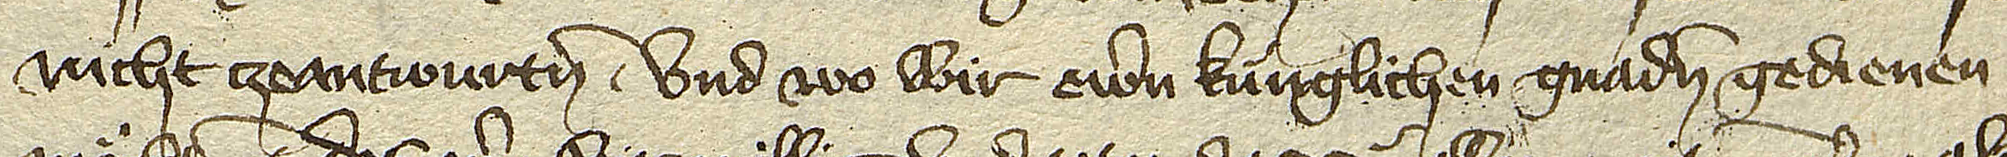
nicht cʒeantwurtn* / vnd wo wir ewn* künglichen gnad*n gedienen
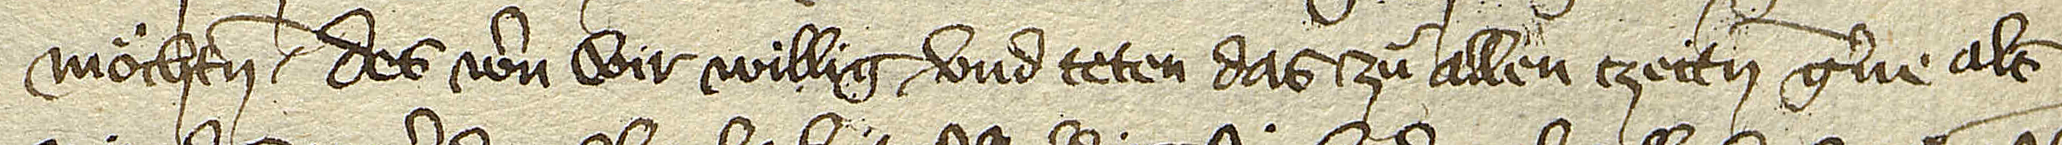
möcht*n / des w*n wir willig / vnd teten das cʒü allen cʒeitn* g*ne als
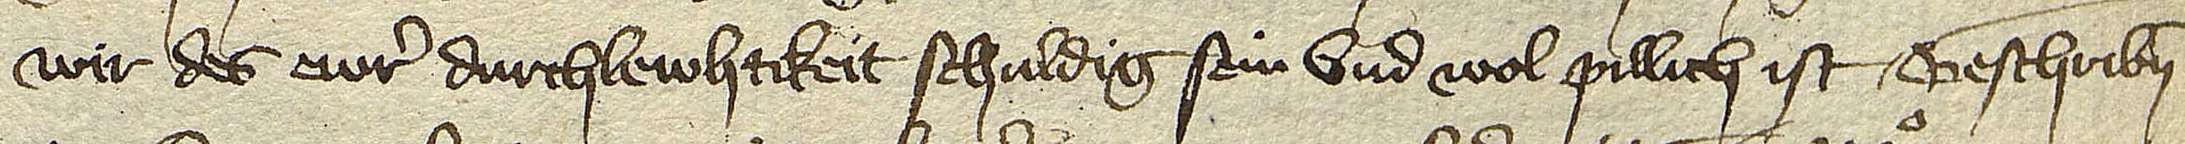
wir des ewr* durchlewhtikeit ſchuldig ſein vnd wol pillich iſt / Geſchribn*
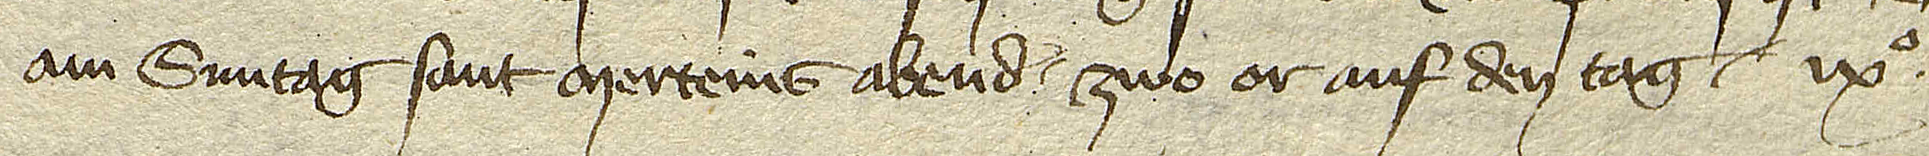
am Suntag ſant Merteins abend / cʒwo or auf den tag / ix*.
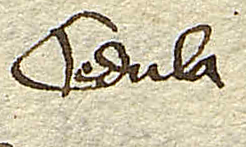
Cedula
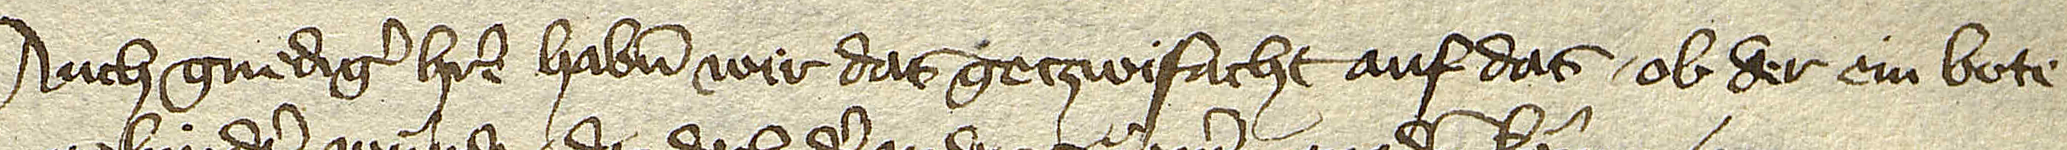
Auch gnedig* hr*e habn* wir das gecʒwifacht auf das / ob der ein bote
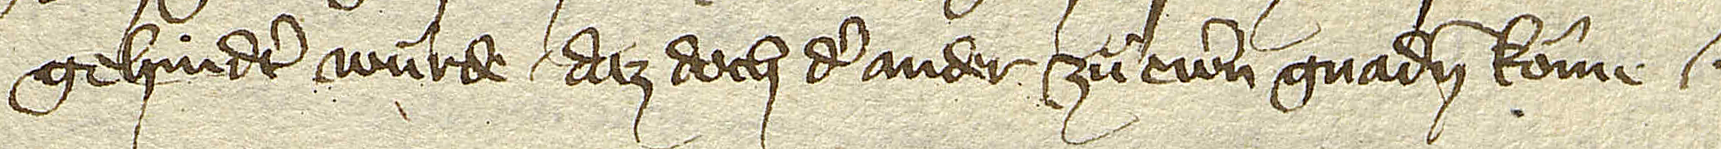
gehindt* würde / daʒ doch d* ander cʒü ewn* gnadn* köme /.
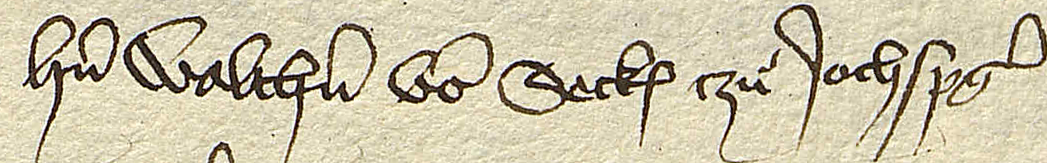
hn* Walthn* vo* Seck* cʒü Iochſpg*
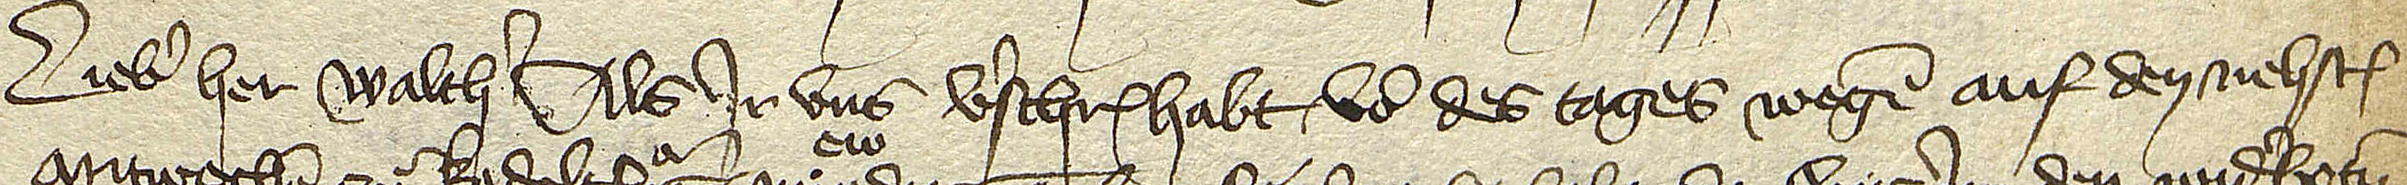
Lieb* her Walth* Als Ir vns v*ſchr* habt / vo* des tages wege* auf den nehſt*
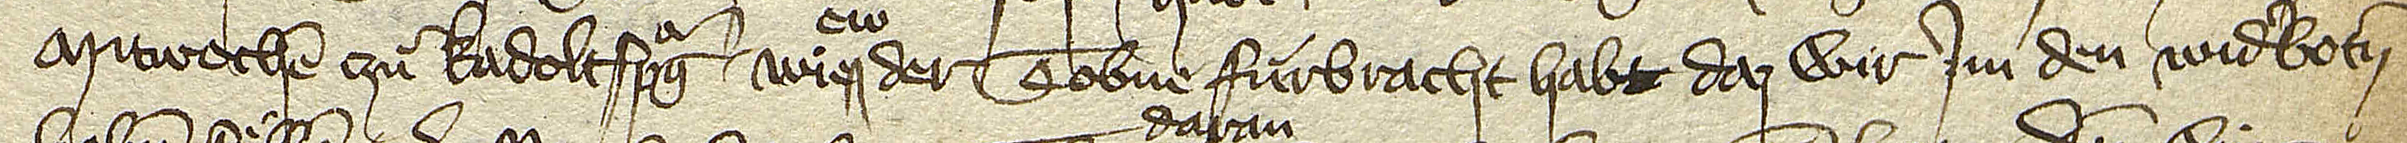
Mitwoche* cʒü kadoltſpg* / wie der Tobne fürbracht habt daʒ wir Im den wid*bot*n
